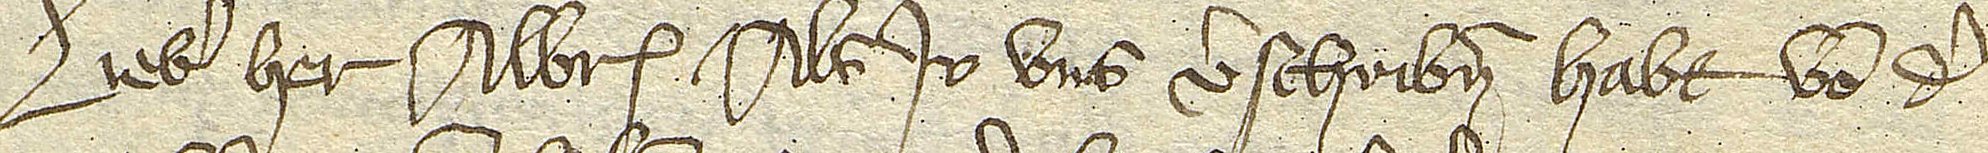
Lieb* her Albr* / Als Ir vns v*ſchribn* habt vo* d*
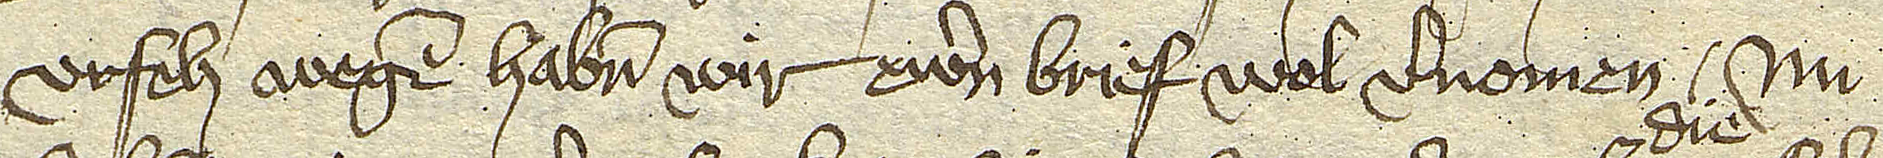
vrfeh* wege* habn* wir ew*n brief wol v*nomen / Nu
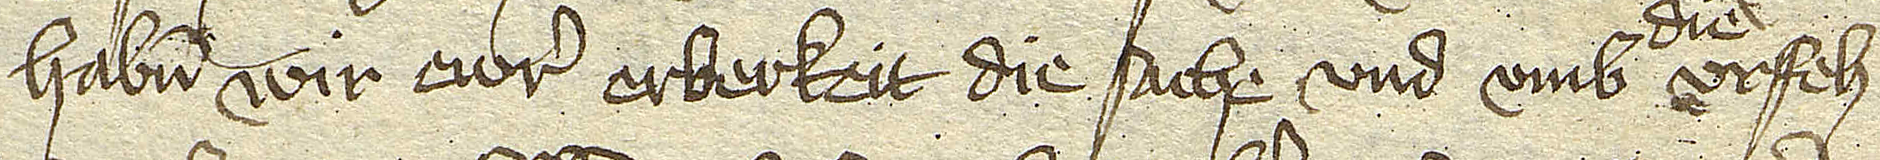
habn* wir ewr* erberkeit die ſache vnd vmb vrfeh
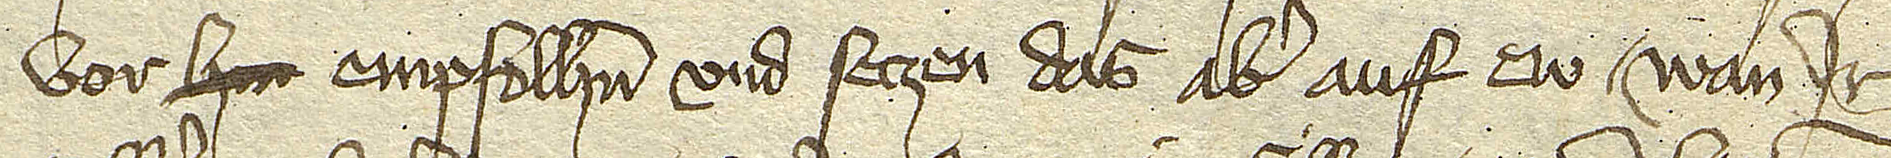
vor hin empfolhn* vnd ſecʒen das ab* auf ew / wan Ir
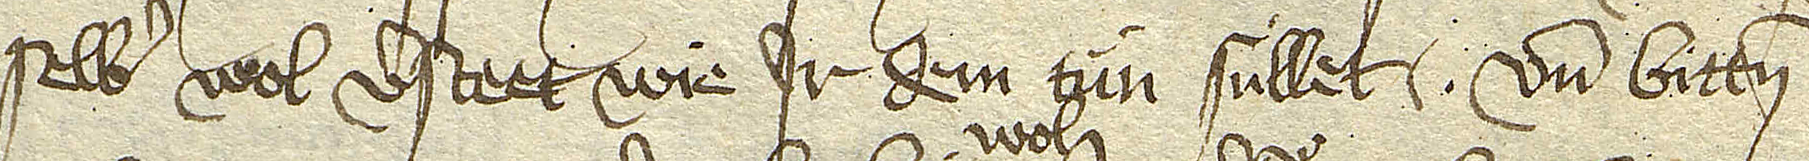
ſelb* wol v*ſteet wie Ir dem tün ſüllet / . vn* bittn*
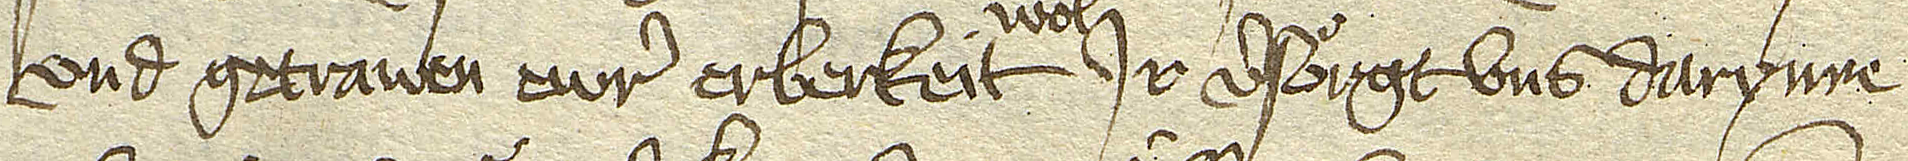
vnd getrawen ewr* erberkeit Ir v*ſörgt vns darynne
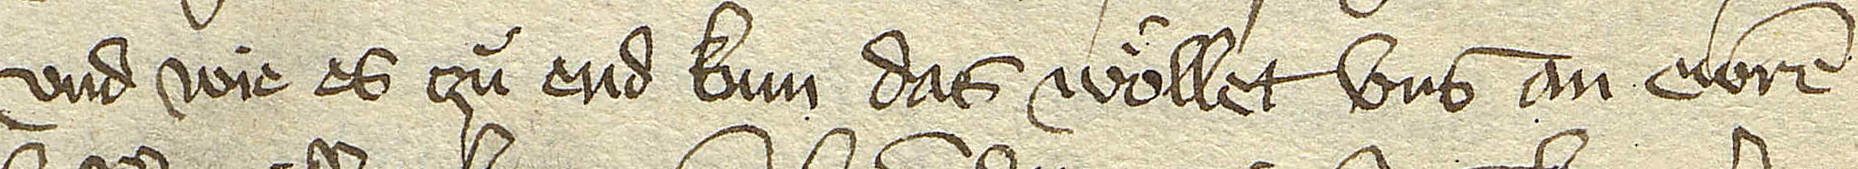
vnd wie es cʒü end kum das wöllet vns an ewre*
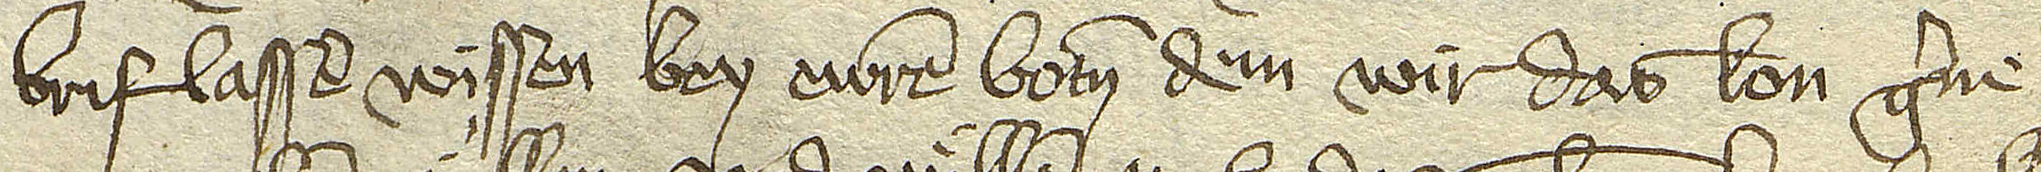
brif laſſe* wiſſen bey ewre* botn* dem wir das lon g*ne
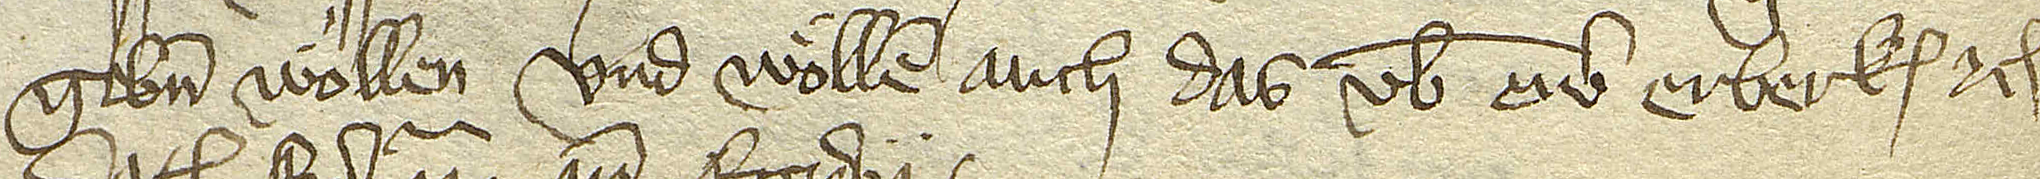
gebn* wöllen vnd wölle* auch das vb* ew* erberk* ec*
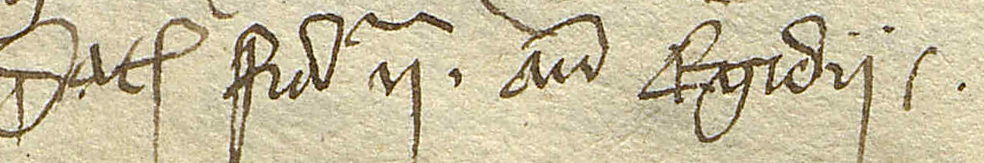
Dat* fia* ii* . an* Egidii / .
